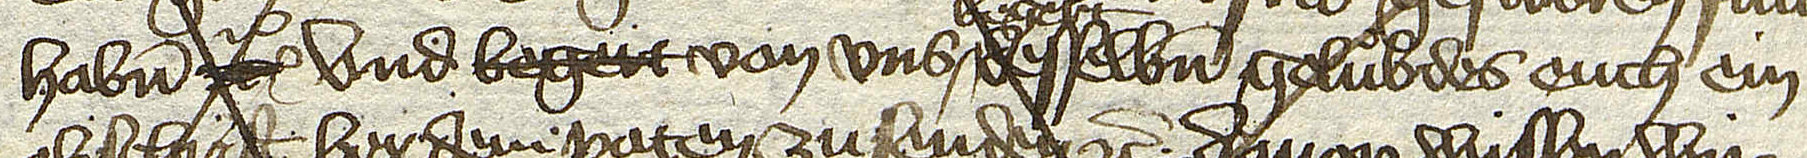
hab*n ec* vnd begert von vns deſſelb*n gelübdes euch ein
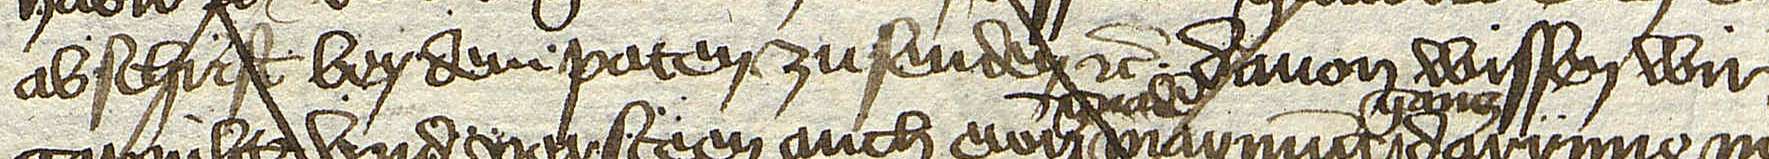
abſchrift bey dem poten ʒu ſenden ec* . dauon wiſſen wir
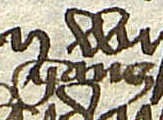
gancʒ
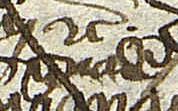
gnad*
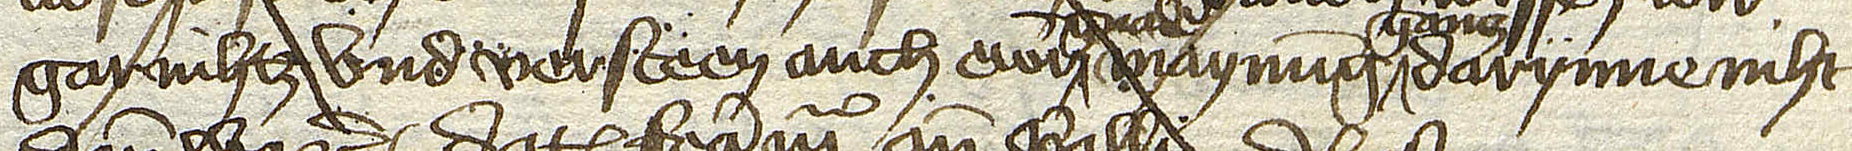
gar nihtʒ vnd verſteen auch ewr maynug* darynne niht
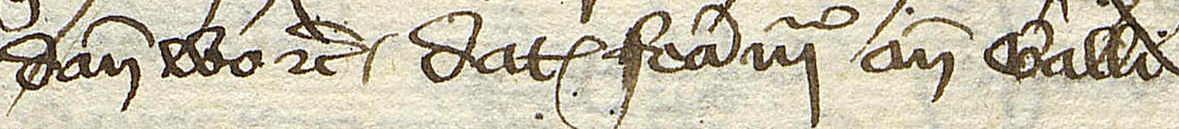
dan* wo ec* / dat* fea* iii* an* Galli
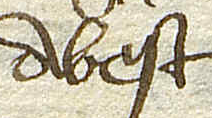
Abest
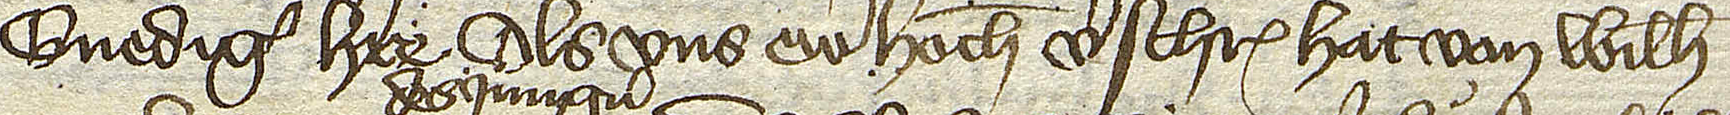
Gnedig* h*re Als vns ew* hoch* v*ſchr* hat von wilh*
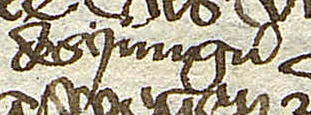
des Iüng*n
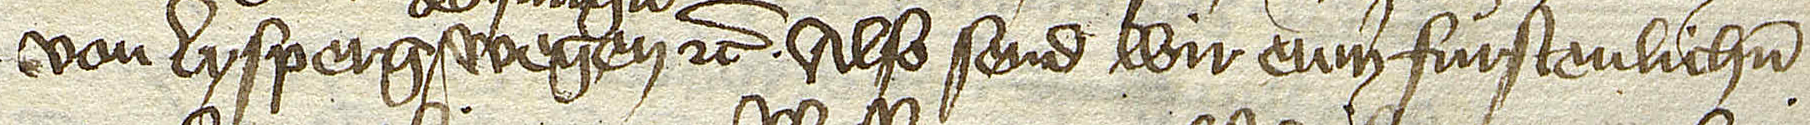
von lyſperg wegen ec* . Alſo ſend wir ew*n fürſtenlich*n
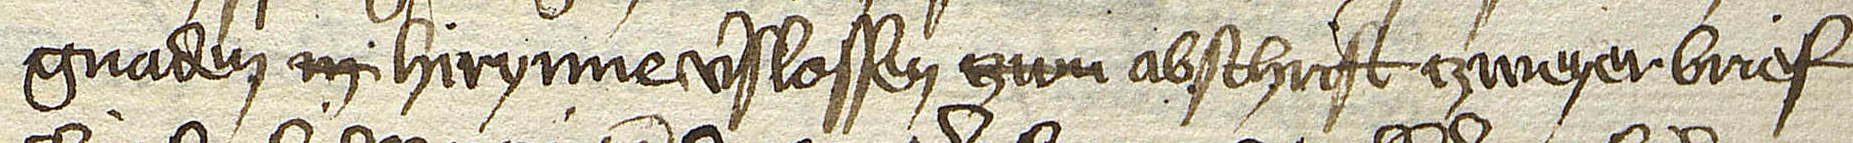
gnaden in hirynne v*ſloſſen cʒwn abſchrift cʒweyer brief
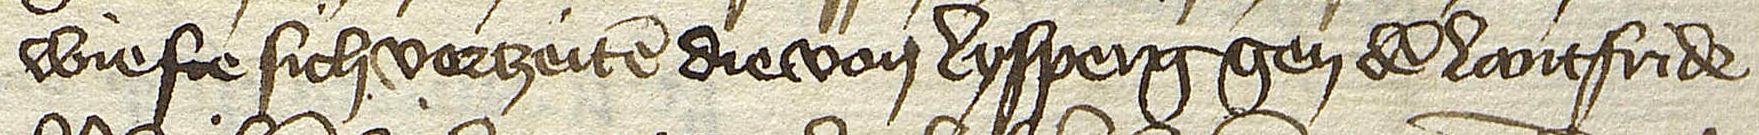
wie ſie ſich vorcʒeite* die von lyſperg gen d* lantfride
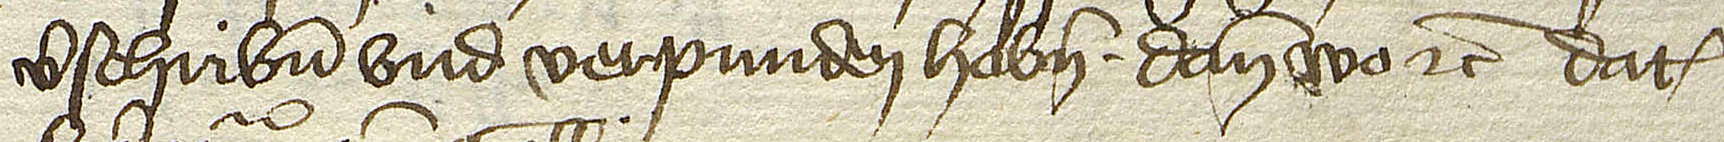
v*ſchrib*n vnd verpunden hab*n . dan* wo ec* dat*
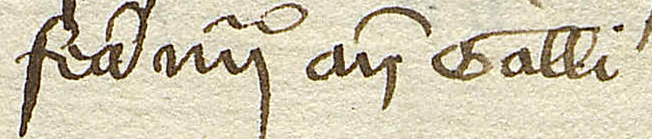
fea* iiii* an* Galli
